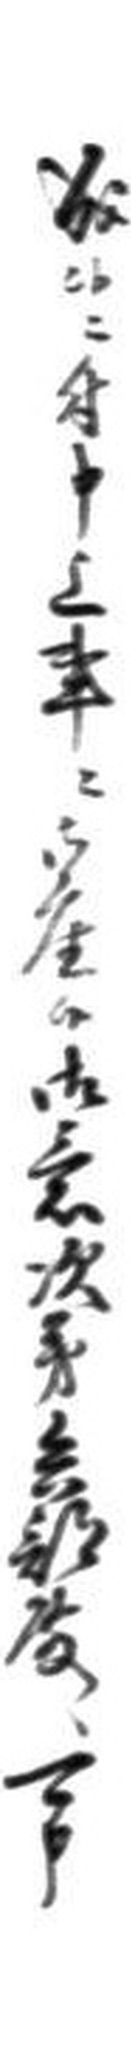成候ニ付申上事ニ御座候御意次第兵部殿へ可申
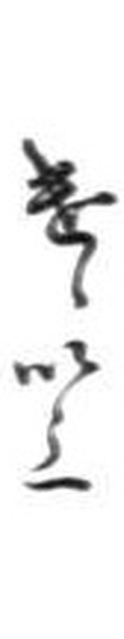遣候以上

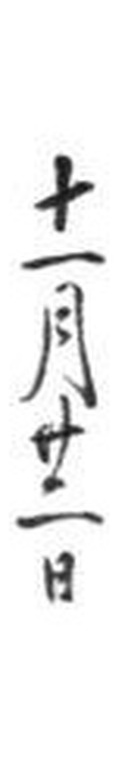十一月廿二日
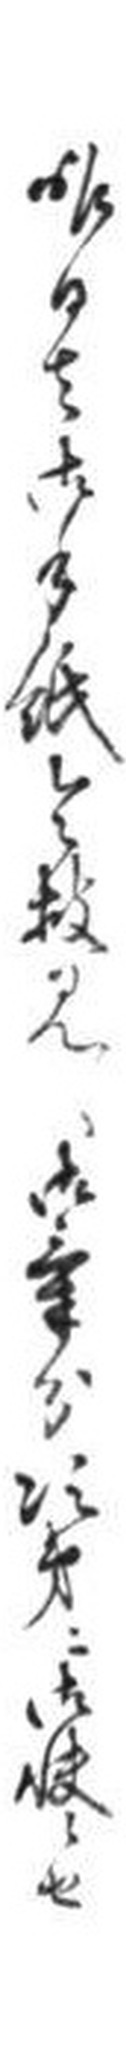昨日者御手紙令披見候御気分次第ニ御快候由
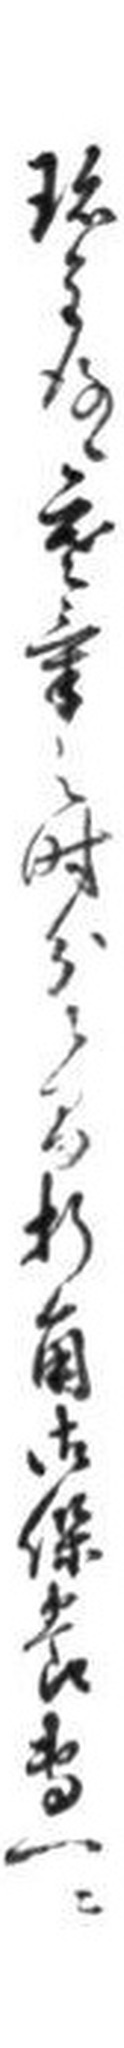珍重存候寒気之時分候間折角御保養専一ニ
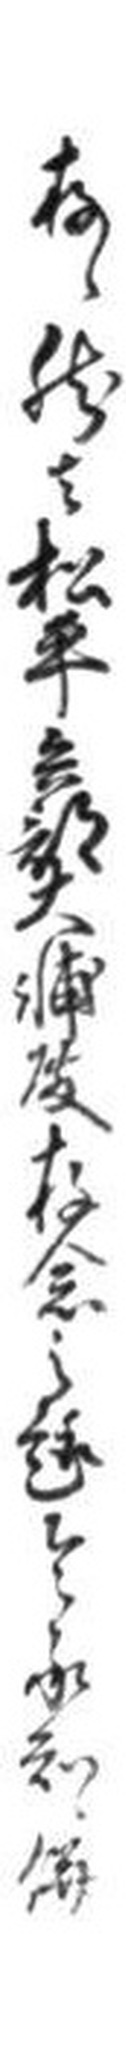存候然者松平兵部大輔殿存念之趣令承知候併
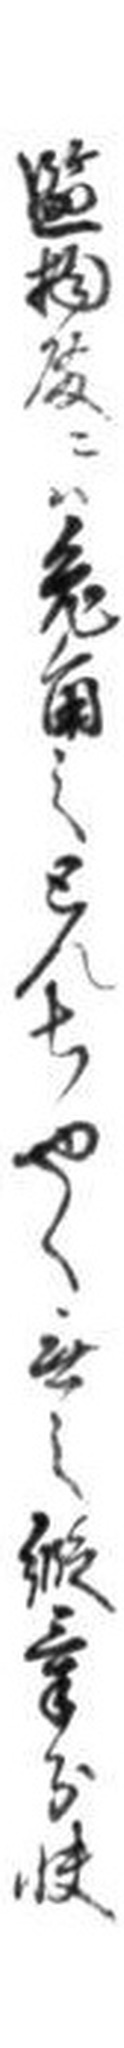監物殿ニハ兎角之とんちやく無之縦気分快
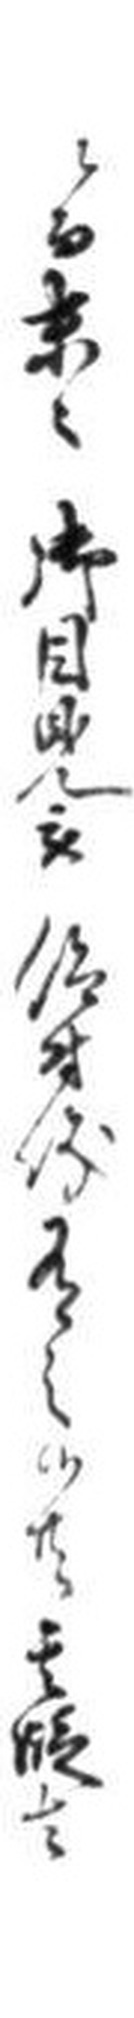候而末々御目見被仰付儀有之候共其段者
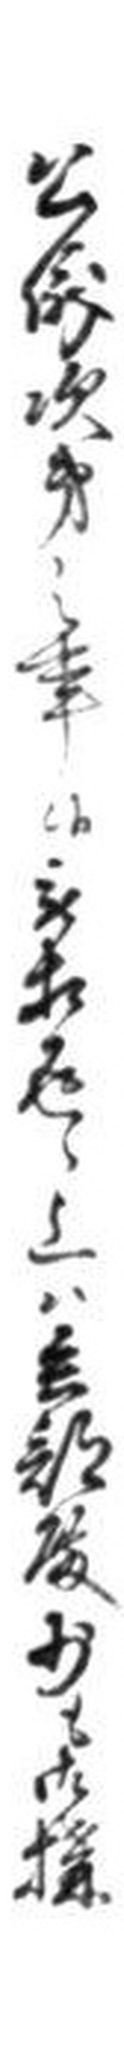公儀次第之事候被相返候上ハ兵部殿少も御構
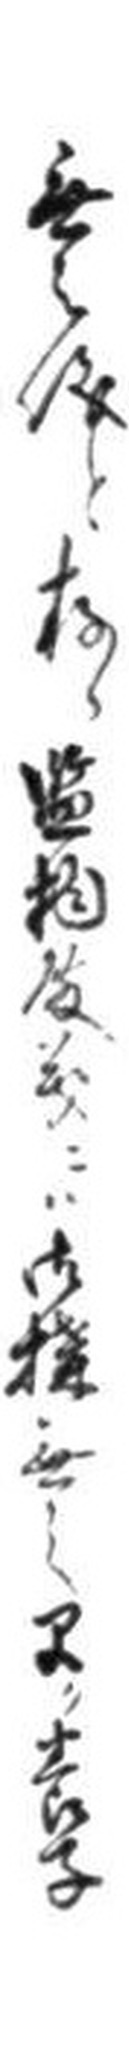無之儀と存候監物殿義ニハ御構無之早ク養子
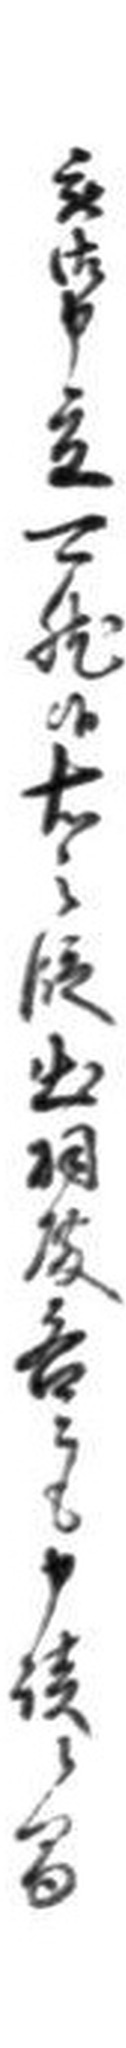被御申立可然候右之段出羽殿各々も申談候間
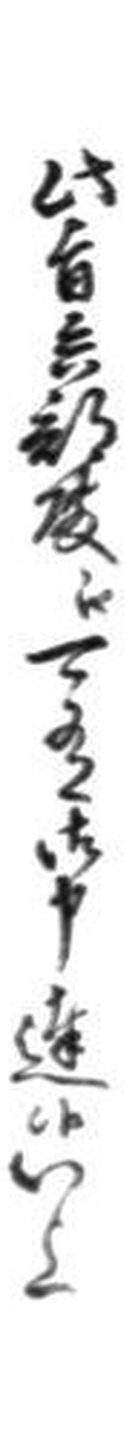此旨兵部殿江可有御申達候以上
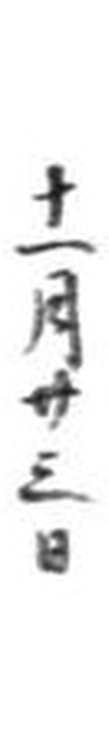十一月廿二日
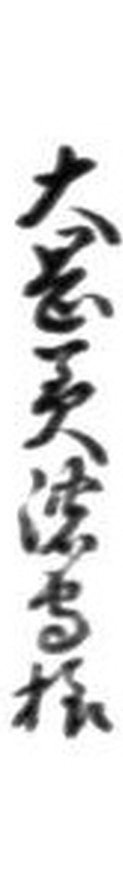大岡美濃守様
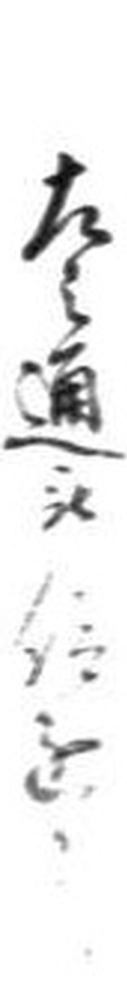左之通被仰遣候
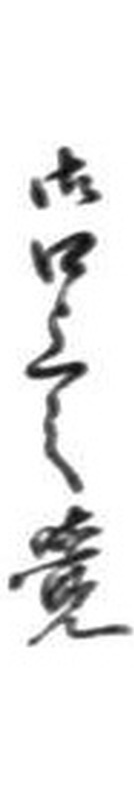御口上之覚
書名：家譜 二十一 吉品公 従元禄十三年到同十四年
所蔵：福井県文書館 Fukui Prefectural Archives
